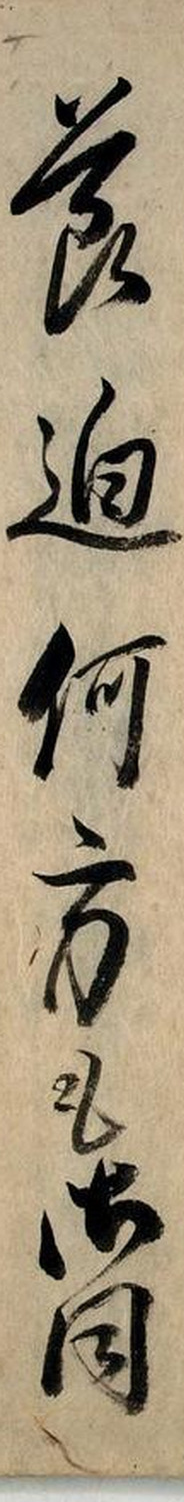節迫何方も御同
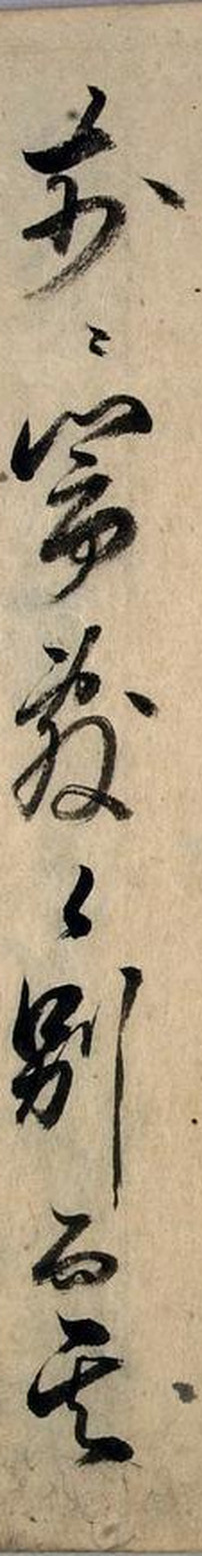前ニ鬧敷候別而其

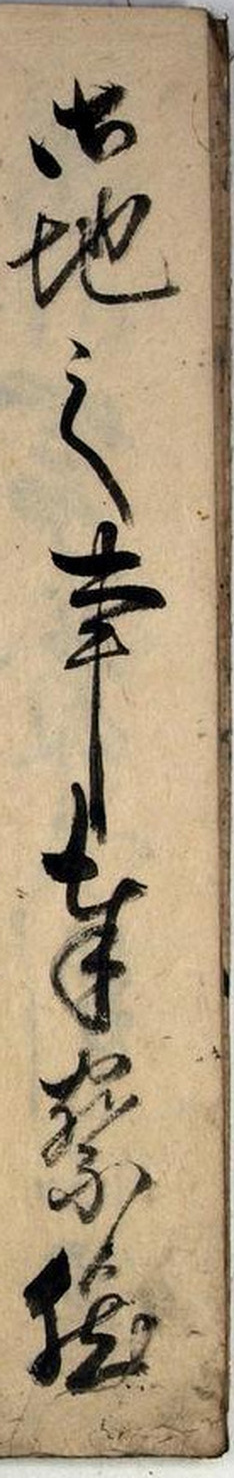御地之事奉察候然
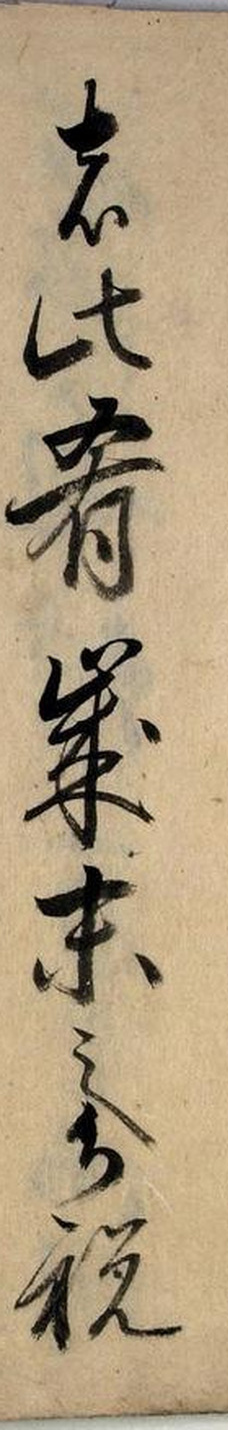者此肴歳末之御祝
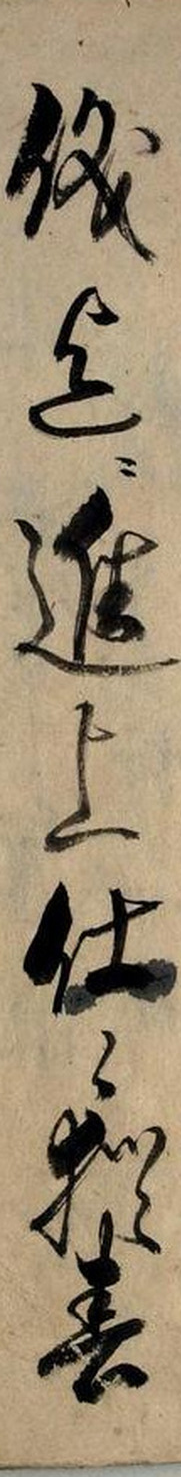儀迄ニ進上仕候猶春
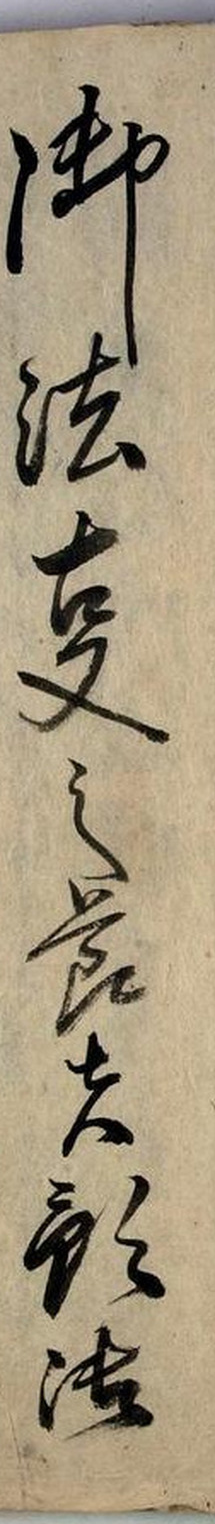御法事之節者預御
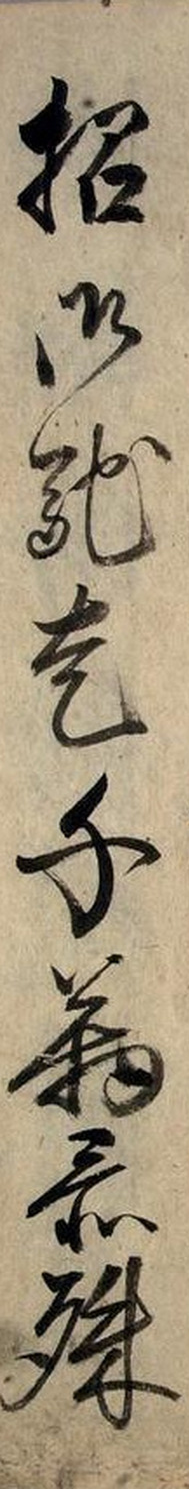招御馳走千萬忝殊

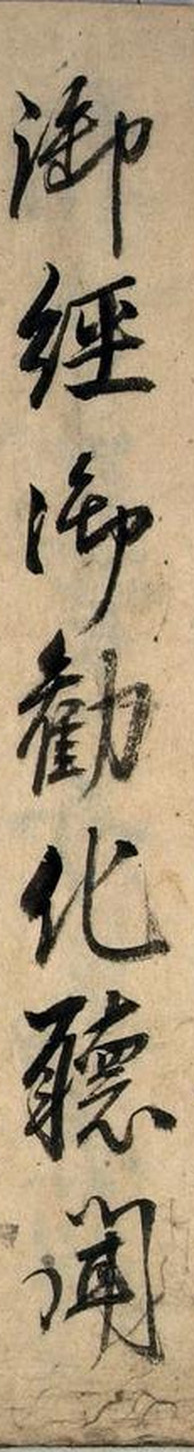御経御勧化聴聞
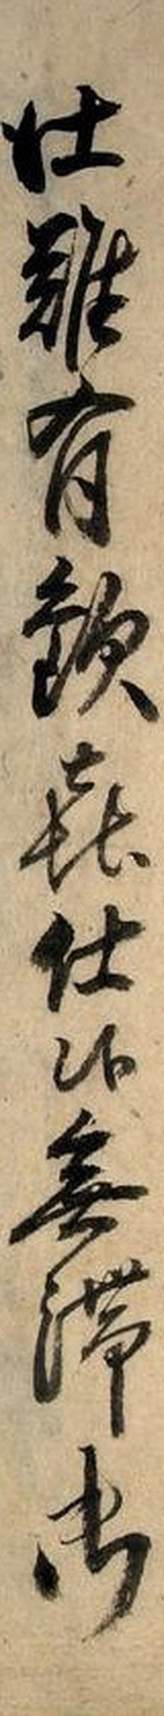仕難有歓喜仕候無滞御
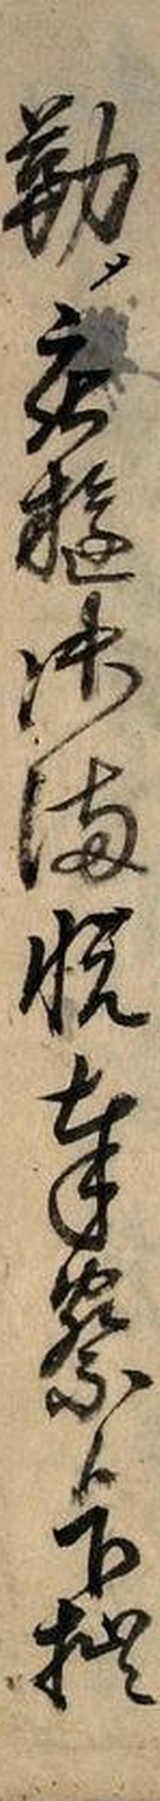勤メ被遊御満悦奉察候下拙
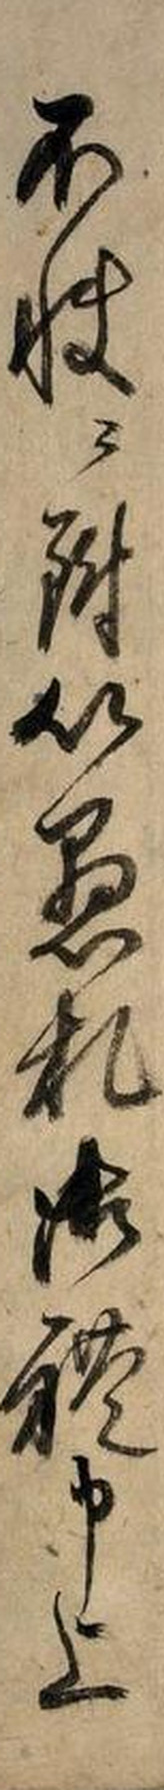不快ニ附以愚札御禮申上
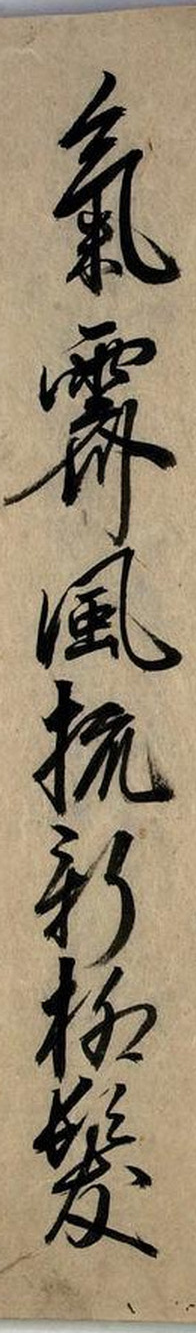気霽風梳新柳髪
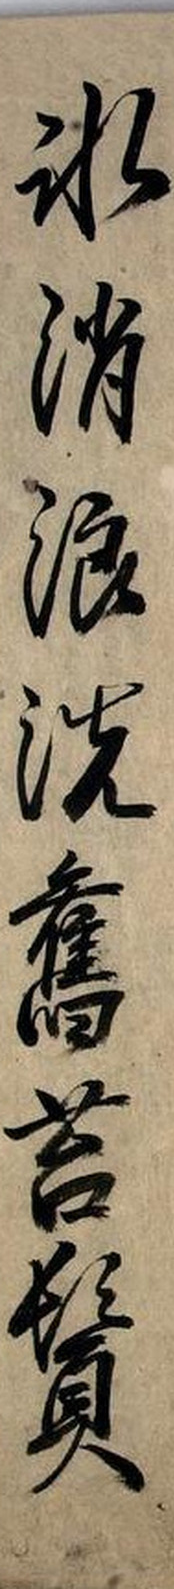氷消浪洗旧苔鬢

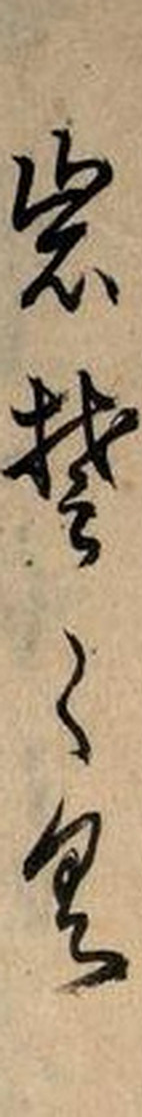岩そゝく
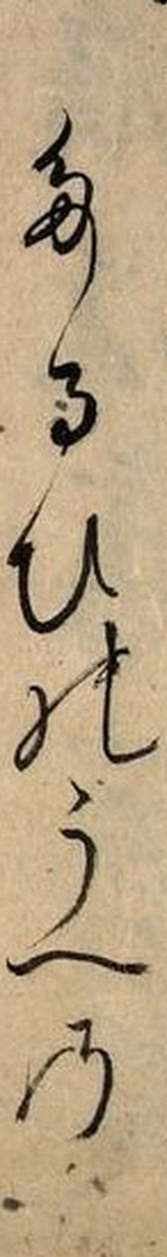たるひのうえの
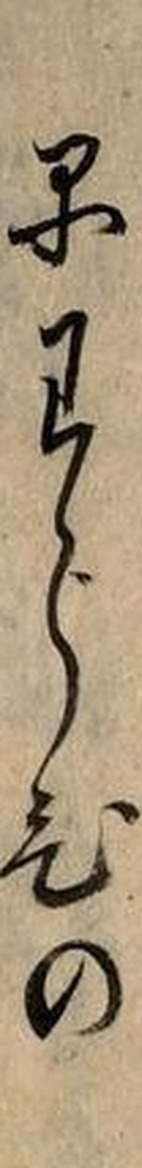さわらひの
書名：御手本（手習、小川浦大網に鯨掛り生捕候由ニ付）
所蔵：福井県文書館 Fukui Prefectural Archives
